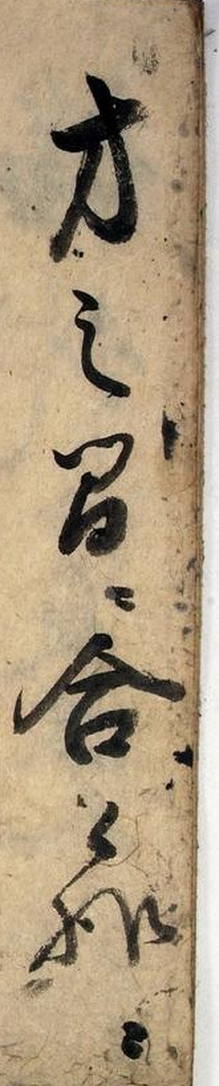方之間ニ合候様ニ
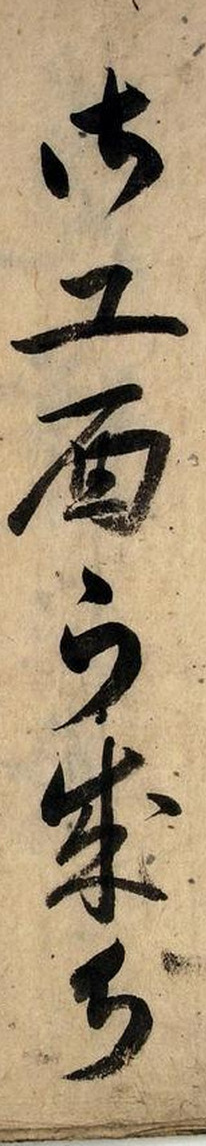御工面被成御
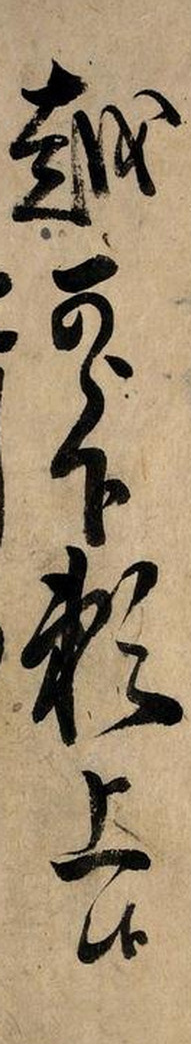越可被下頼上候
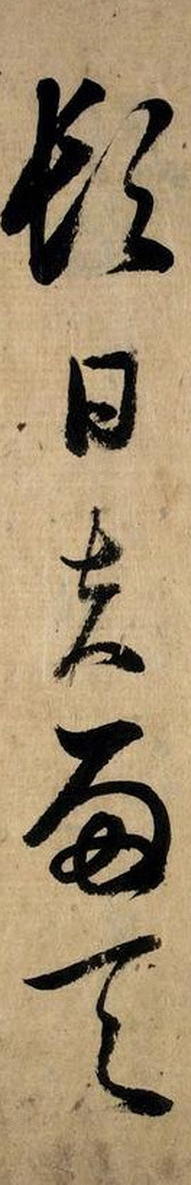頓日者雨天
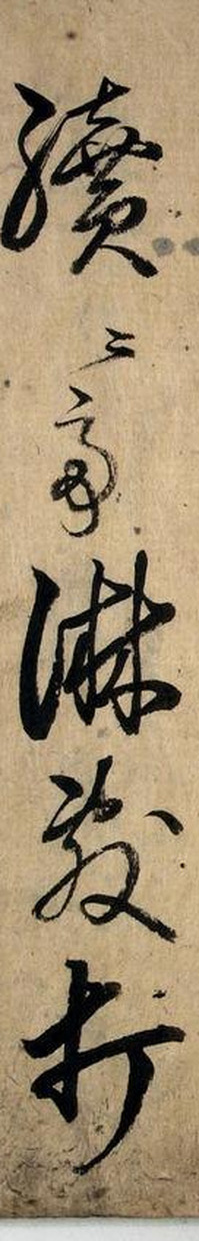続ニて淋敷打

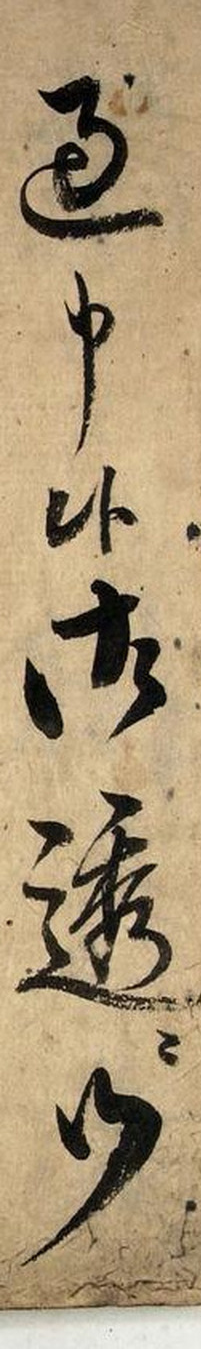過申候御透ニ御
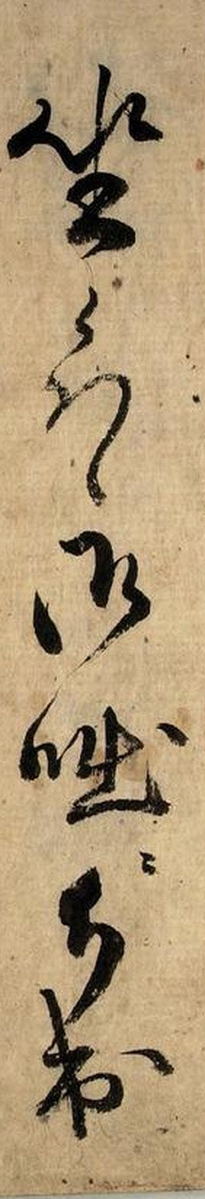座候ハゝ御咄ニ御出
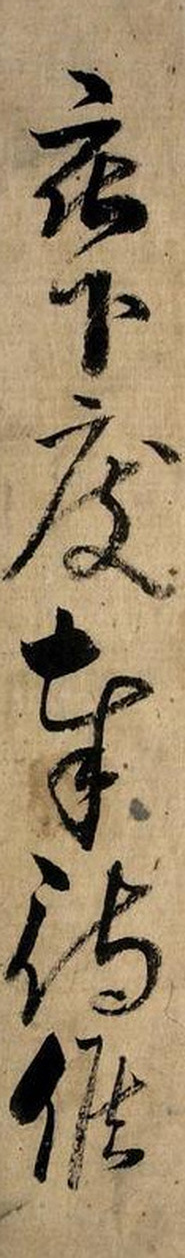被下度奉待候
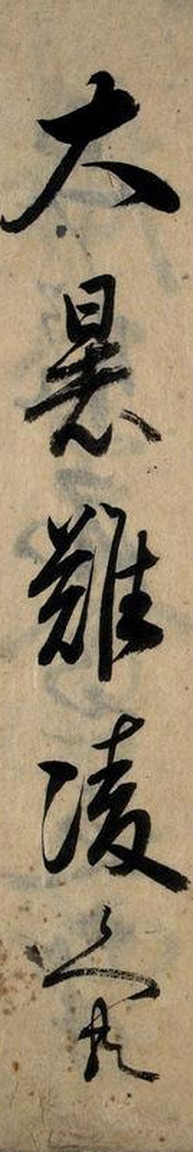大暑難凌候へ共
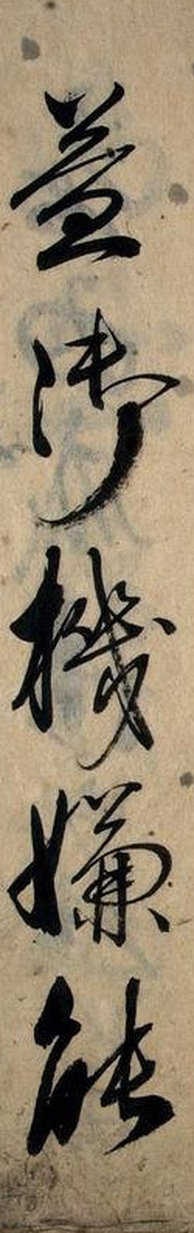益御機嫌能

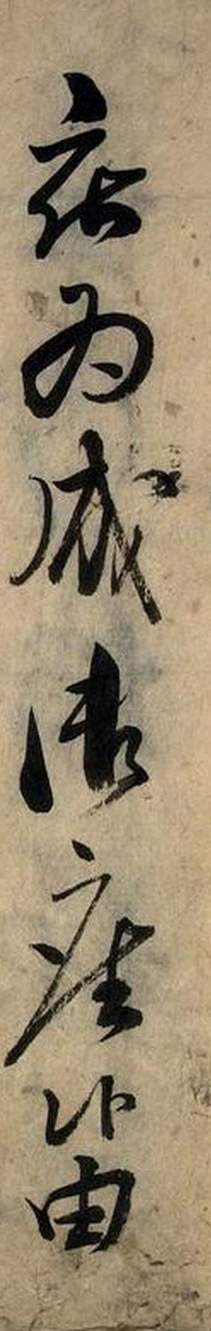被為成御座候由
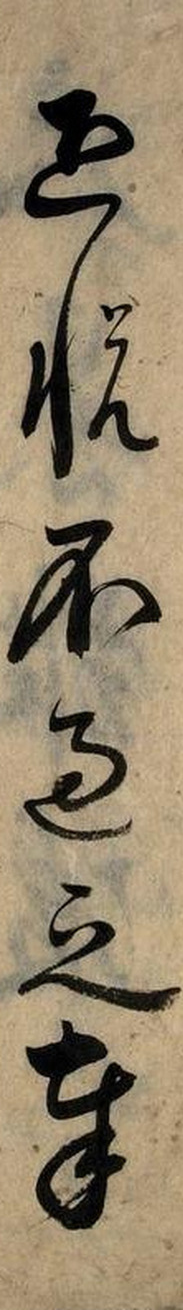恐悦不過之奉
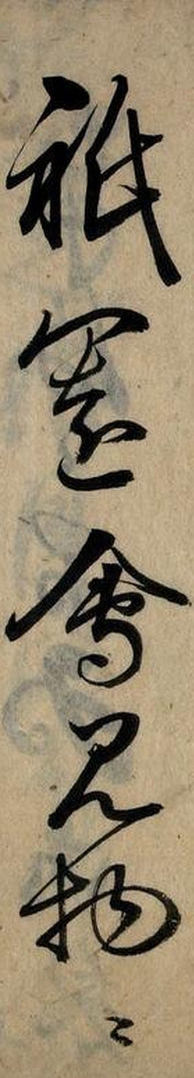祇園会見物ニ
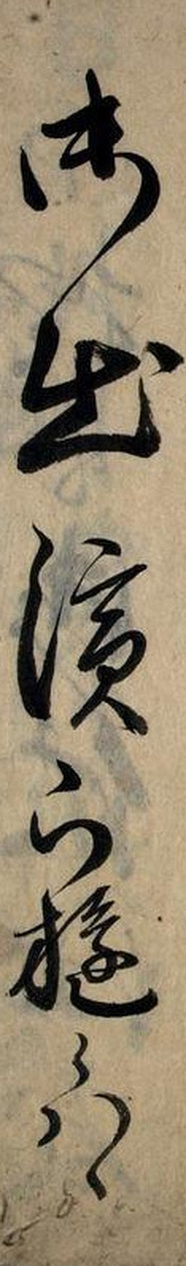御出演被遊候ハゝ

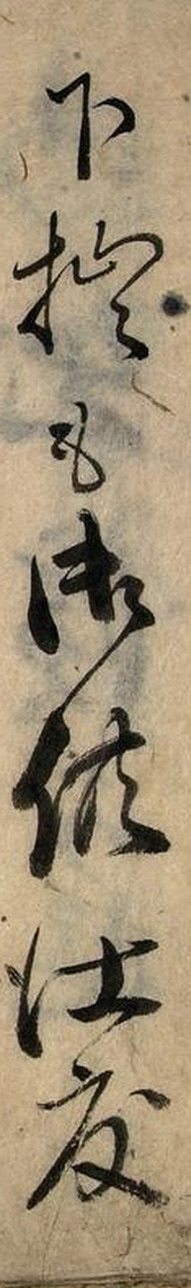下拙も御供仕度
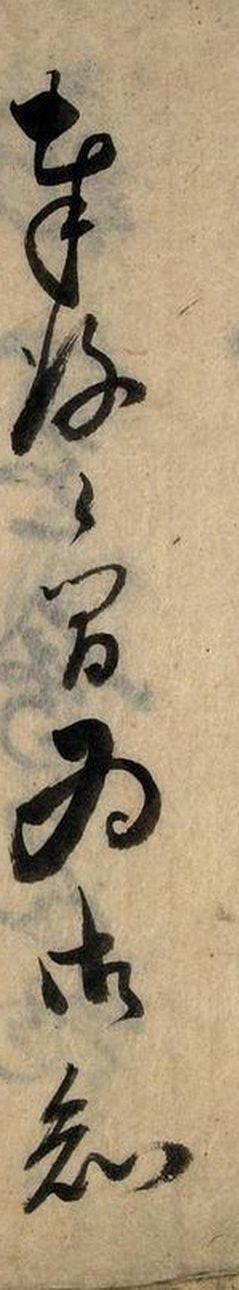奉存候間為御知
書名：御手本（手習、小川浦大網に鯨掛り生捕候由ニ付）
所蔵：福井県文書館 Fukui Prefectural Archives
